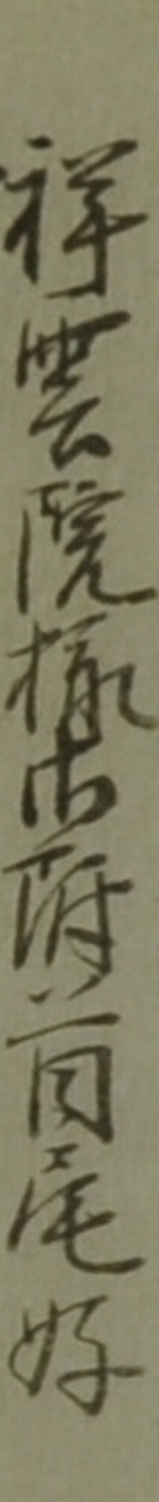祥雲院様御附首尾好
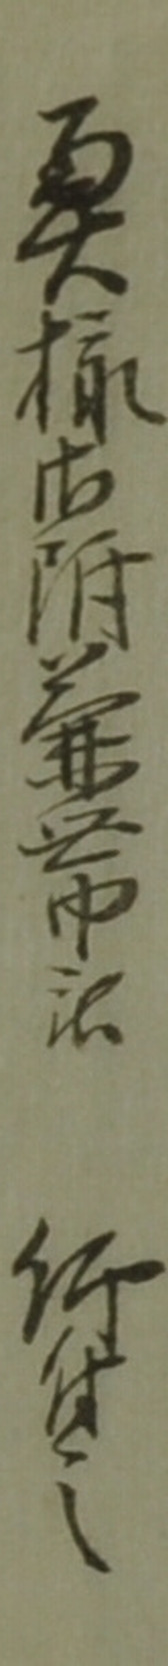奥様御附兼帯被仰付之
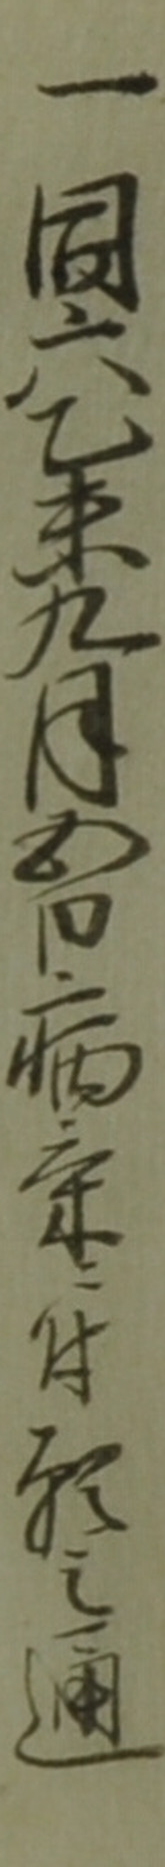一同六乙未九月五日病気ニ付願之通
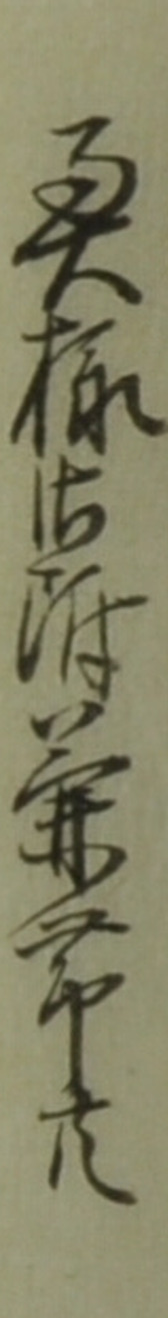奥様御附兼帯共
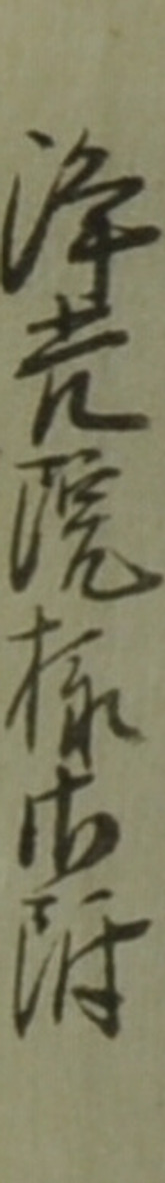浄光院様御附

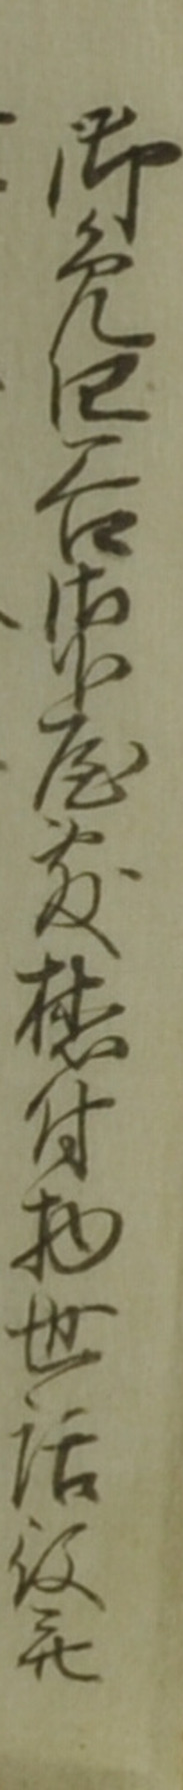御免四谷御下屋敷◻︎付物世話役并
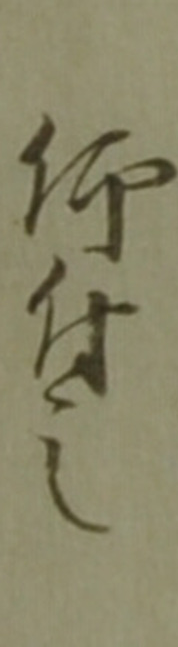仰付之
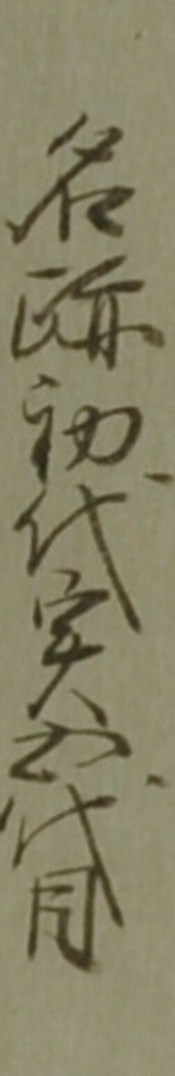名跡初代実五代目
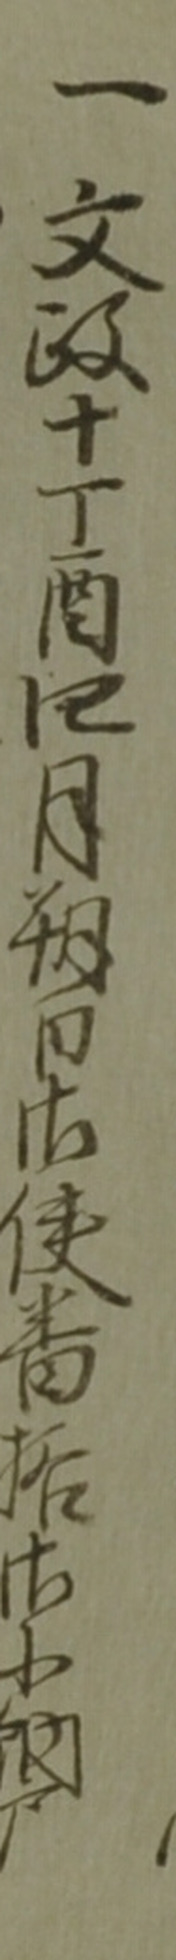一文政十丁酉四月朔日御使番格御小納戸
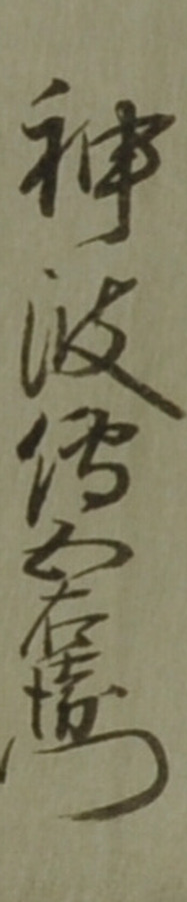神波伝五右衛門
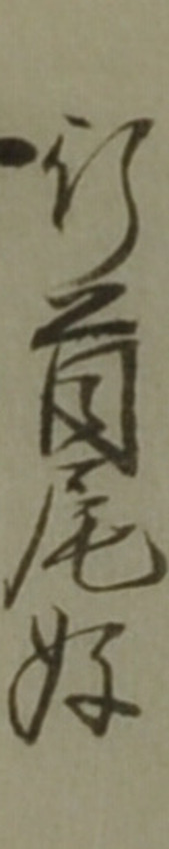行首尾好
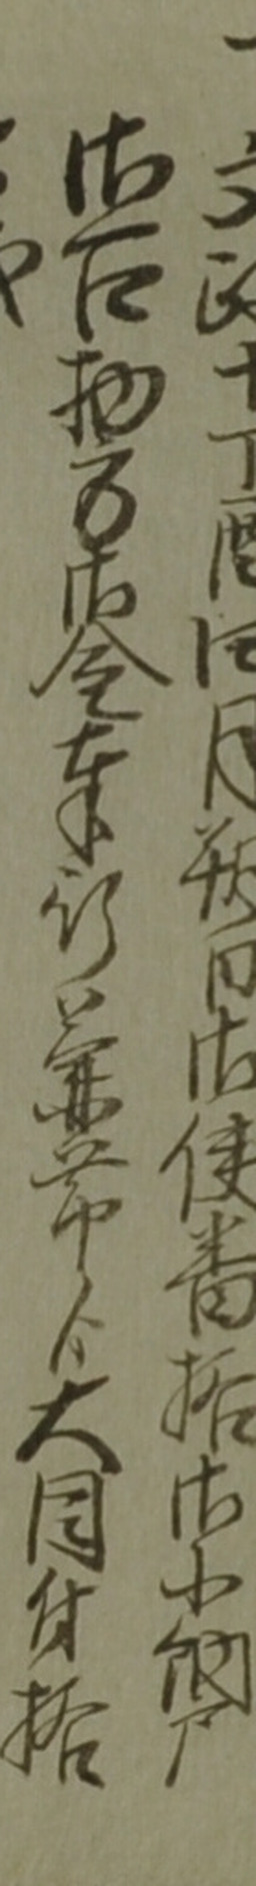御召物方御金奉行兼帯ゟ大目付格
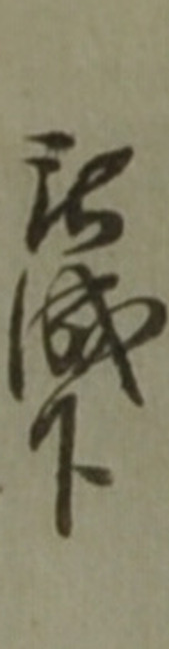被成下
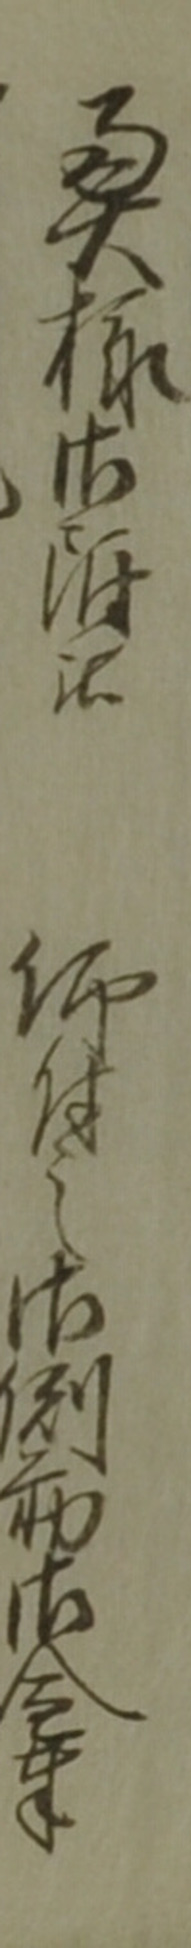奥様御附被仰付之御側勤御金奉
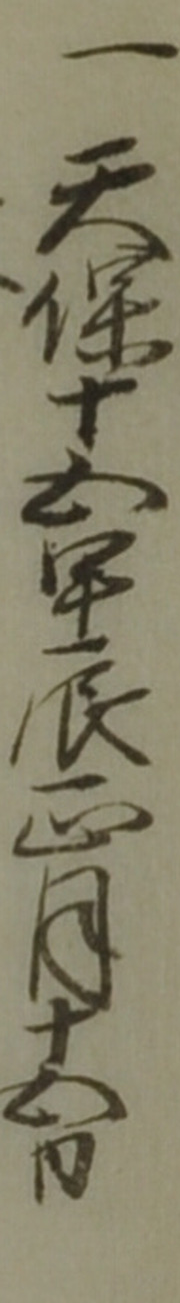一天保十五甲辰正月十五日
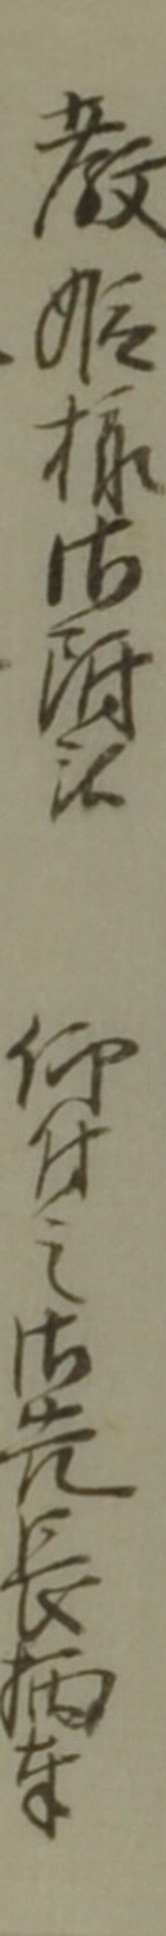教姫様御附被仰付之御先長柄奉
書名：諸御役代々録（六）
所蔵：伊那市立高遠町図書館・合同会社AMANE
